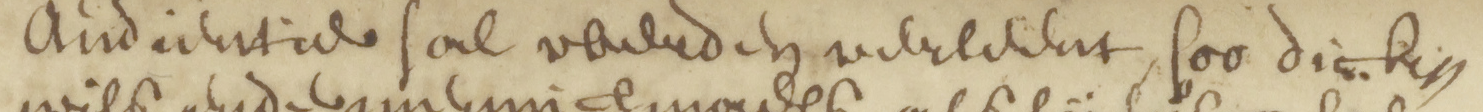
Audientie sal werden verleent, soo dick„
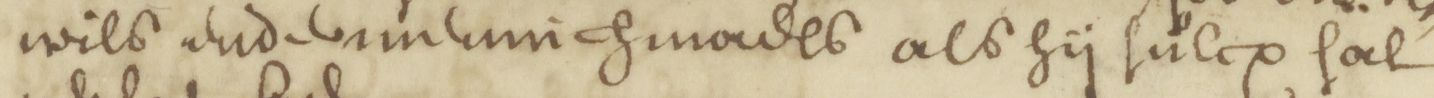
wils ende mennichmaels als hij sulcx sal
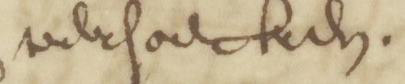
versoecken.
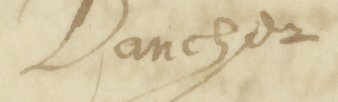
Dancher
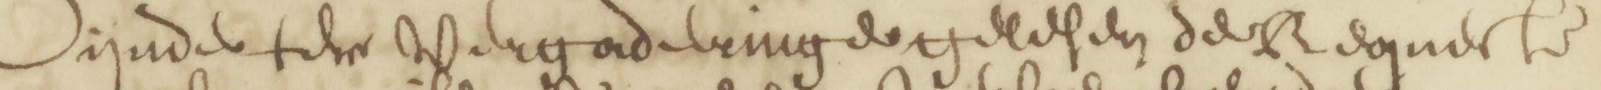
Sijnde ter Vergaderinge gelesen de Requeste
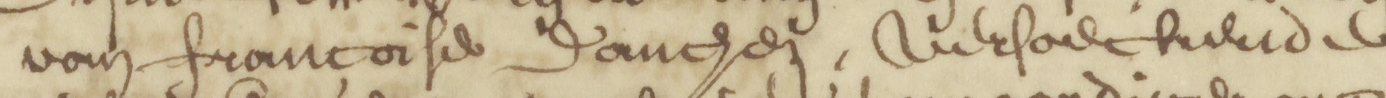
van francoise Danchen, versoeckende
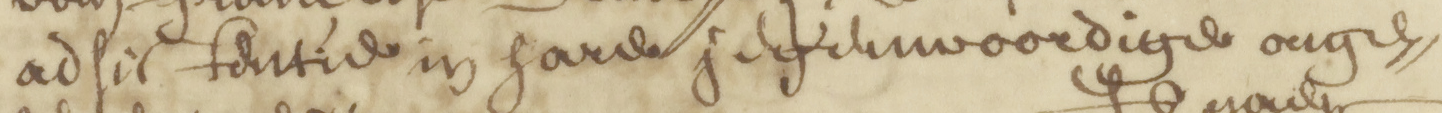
adsistentie in hare jegenwoordige onge„
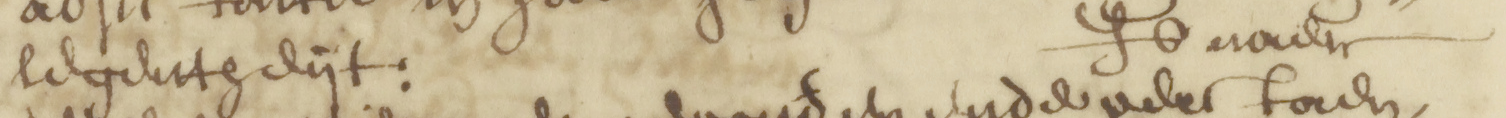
legentheijt: Is naer
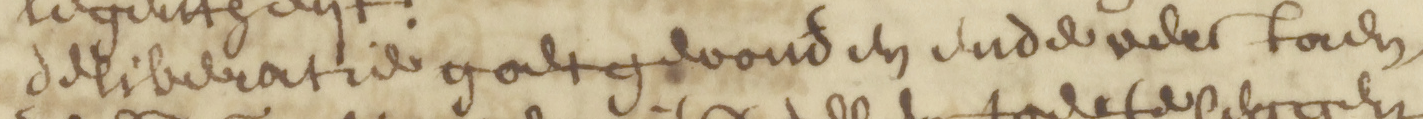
deliberatie goetgevonden ende verstaen,
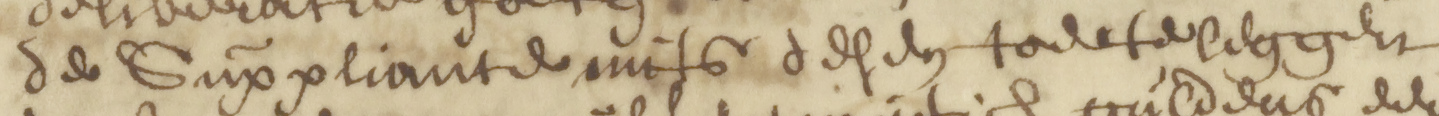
de Suppliante mits desen toe te leggen
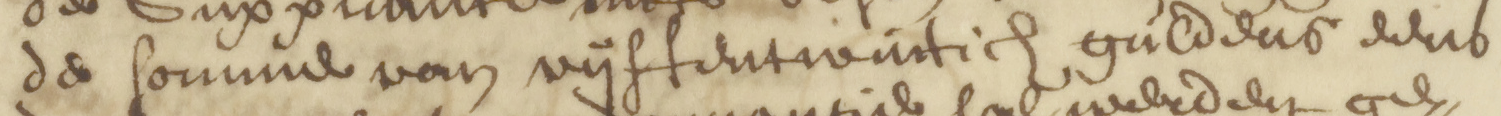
de somme van vijffentwintich guldens eens
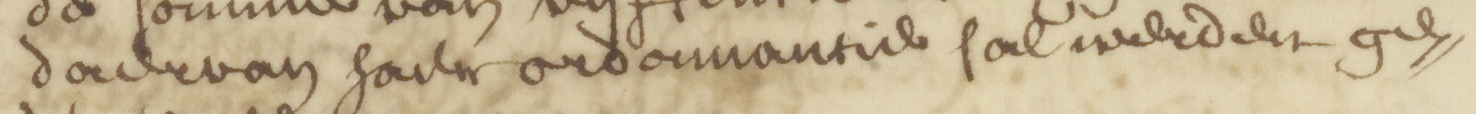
daervan haer ordonnantie sal werden ge,
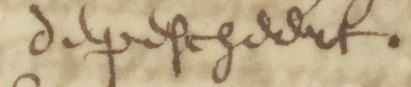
depescheert.
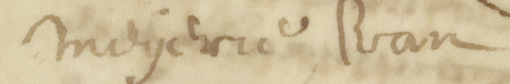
meijere van
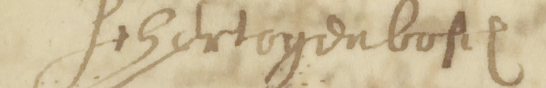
s‛hertogenbosch
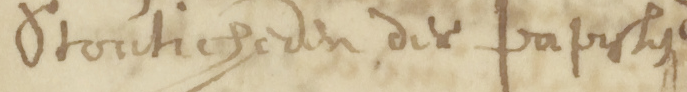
Stouticheden der papisten
